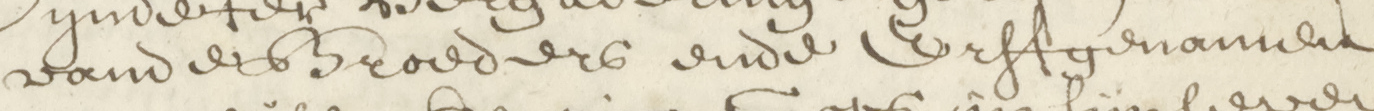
vande Broeders ende Effgenamen
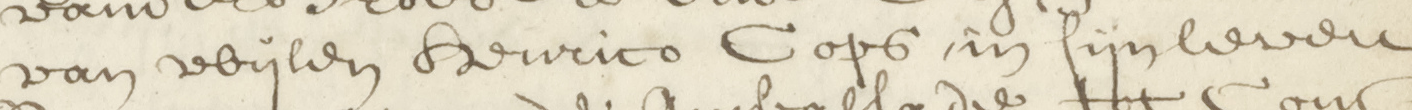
van wijlen Henrico Cops, in sijn leven
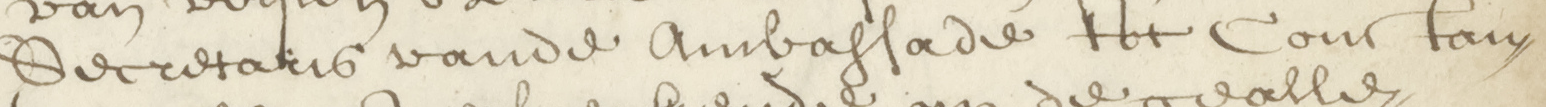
Secretaris vande Ambassade tot Constan„
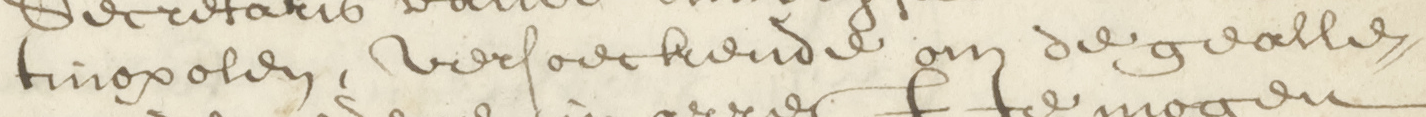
tinopolen, versoeckende om de gealle„
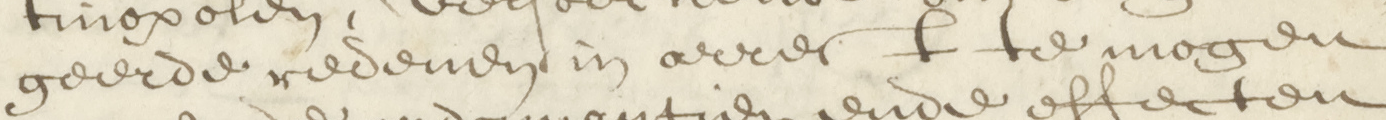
geerde redenen in arrest te mogen
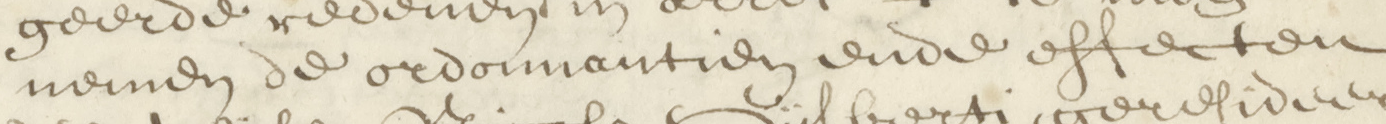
nemen de ordonnantien ende effecten
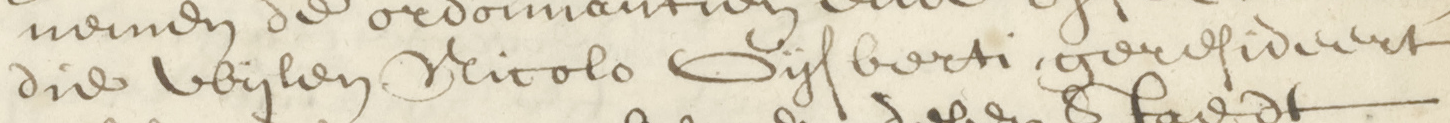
die wijlen Nicolo Gijsberti, geresideert
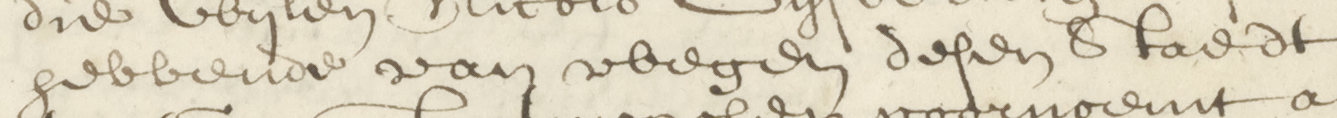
hebbende van wegen desen Staedt
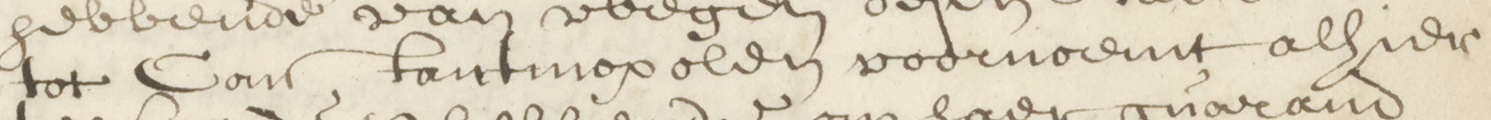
tot Constantinopolen voornoemt alhier
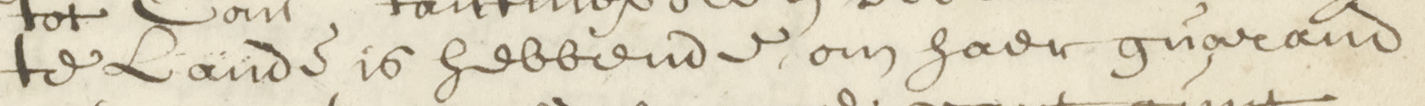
te Lande is hebbende, om haer guarand
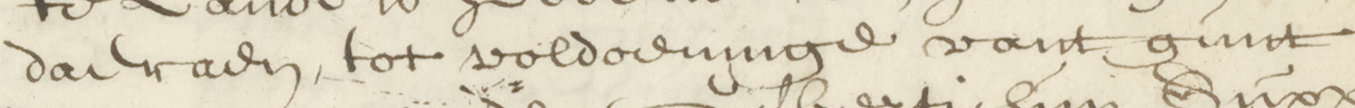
daeraen, tot voldoeninge vant gunt
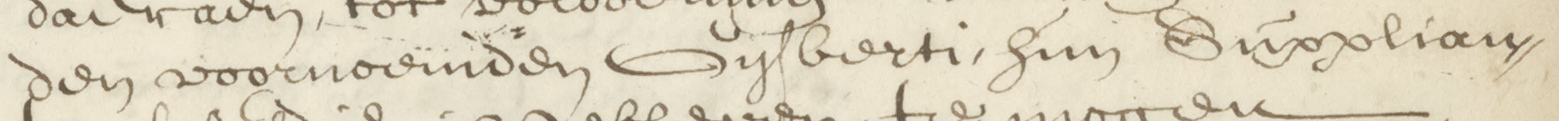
den voornoemden Gijsberti, hun Supplian„
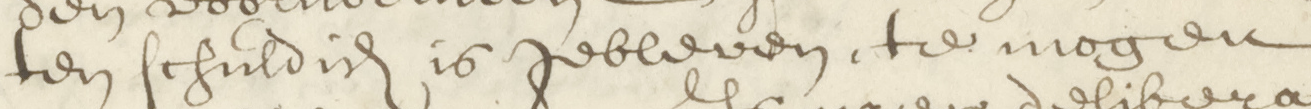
ten schuldich is gebleven, te mogen
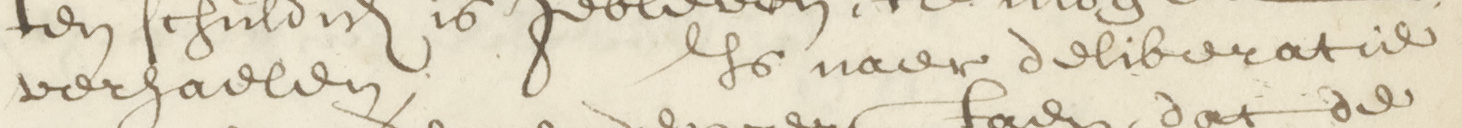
verhaelen, Is naer deliberatie
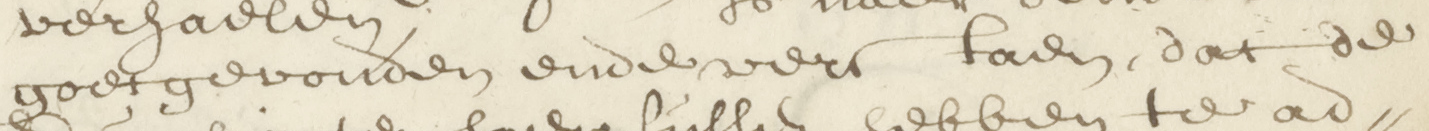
goetgevonden ende verstaen, dat de
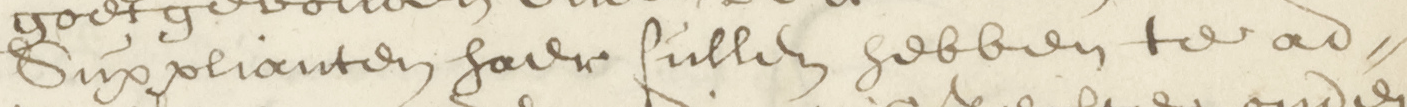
Supplianten haer sullen hebben te ad„
